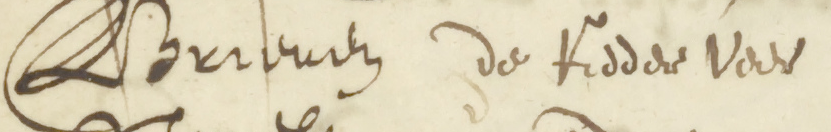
Brienen de Ridder Veer
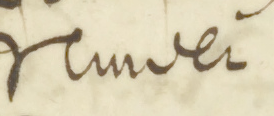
Niuelt
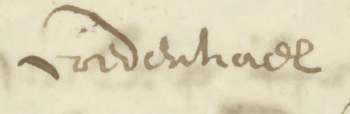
credentiael
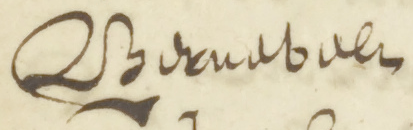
Bernevelt
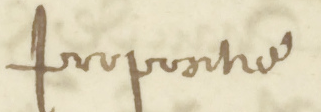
propositie
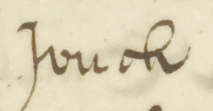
Jonck
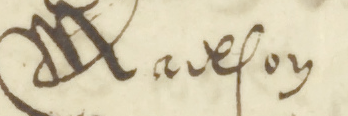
Maelson
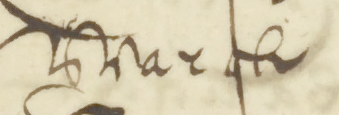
Warck
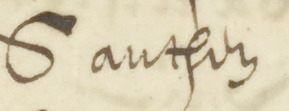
Santhen
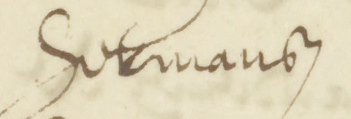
Hermansz
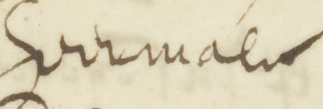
Heermale
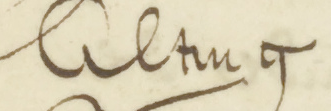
Alting
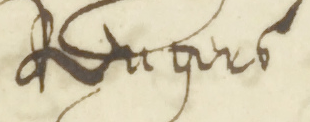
Kugers
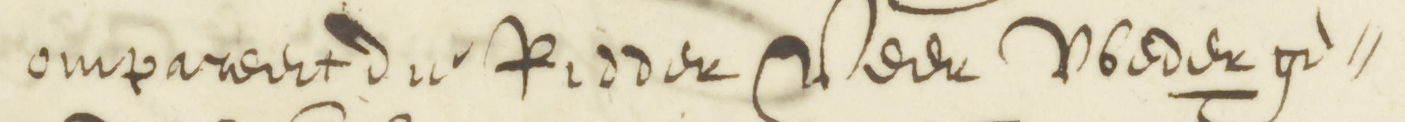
Compareert die Ridder Veer wederge„
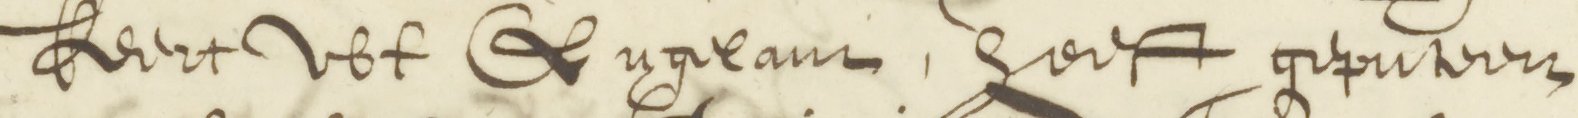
keert Wt Engelant, heeft gepnteert
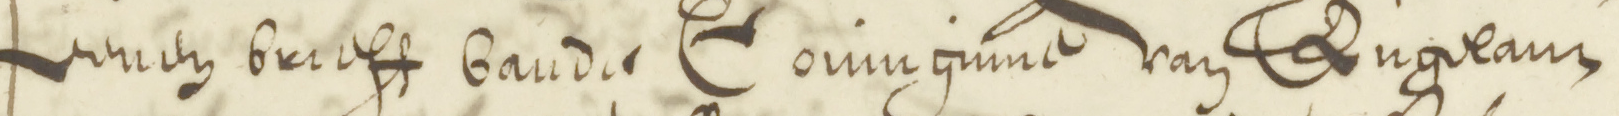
eenen brieff vande Coninginne van Engelant
